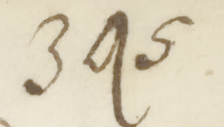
395
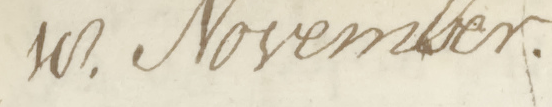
18. November.
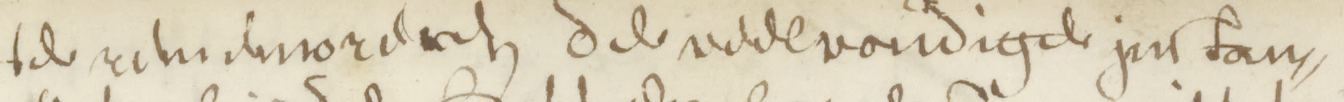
te rememoreren de veelvoudige instan„,
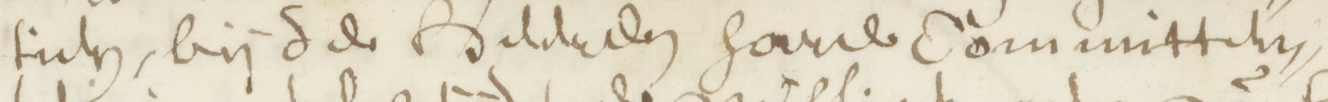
tien, bij de Heeren hare Committen,,
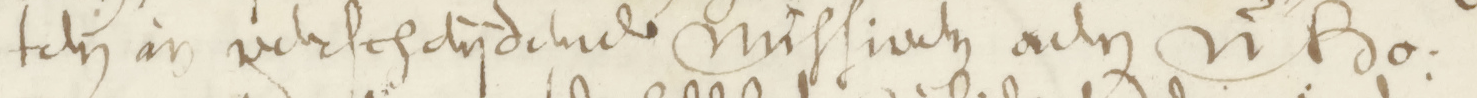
ten in verscheijdene missiven aen U. Ho:
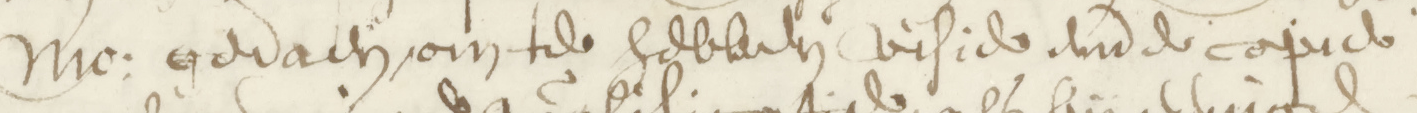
Mo: gedaen, om te hebben visie ende copie
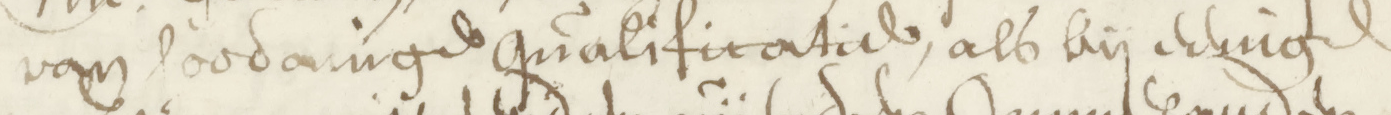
van soodanige qualificatie, als bij eenige
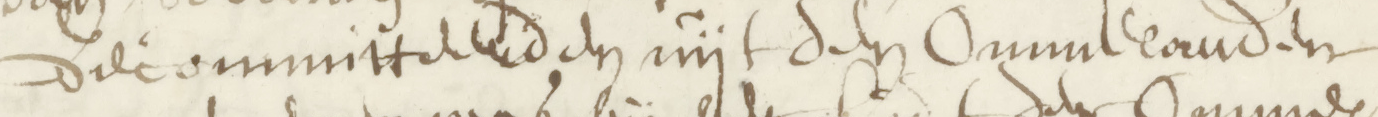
Gecommitteerden uijt den Ommelanden
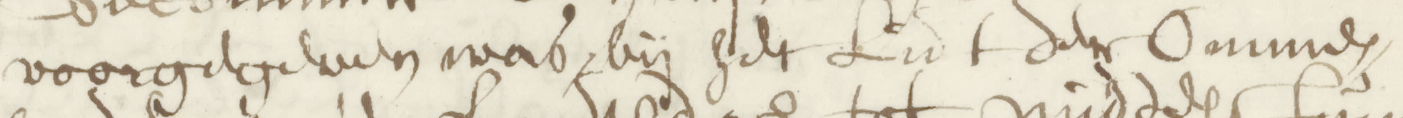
voorgegeven was, bij het Lidt der Omme„
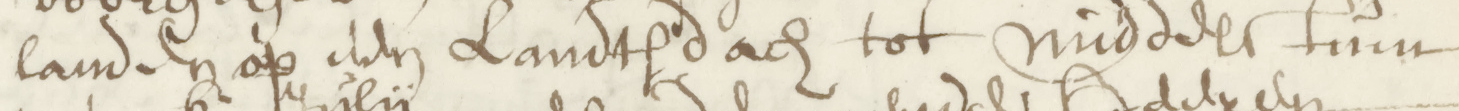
landen op een Landtsdach tot Middelstum
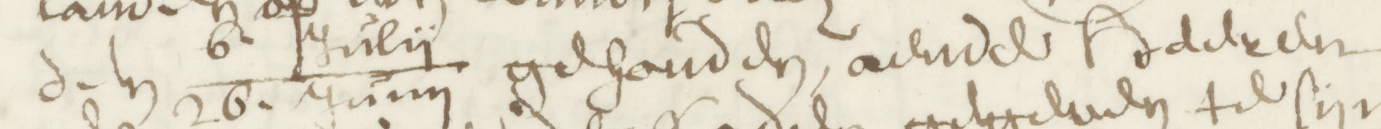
den 6. Julij/26. Juny gesonden, aende Heeren
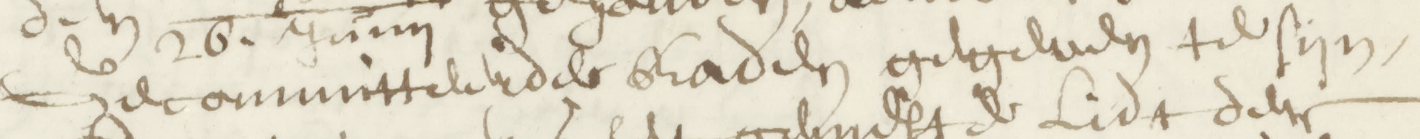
Gecommitteerde Raden gegeven te sijn,
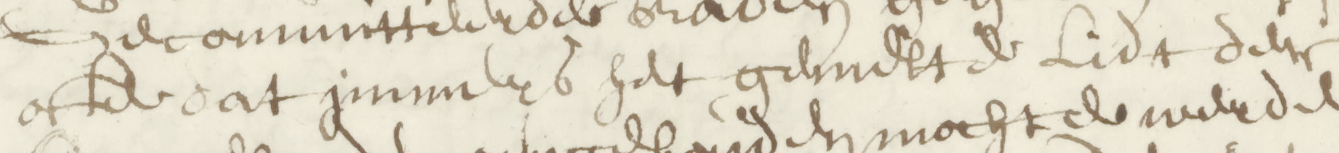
ofte dat immers het gemelte Lidt der
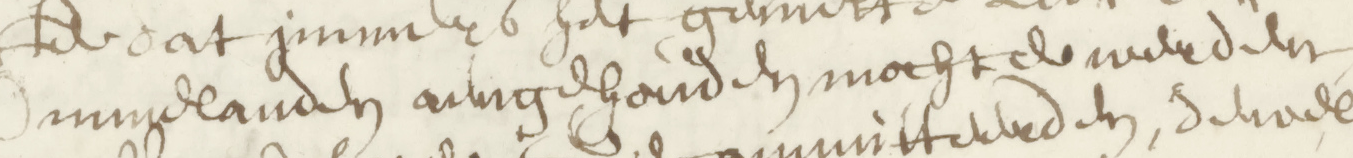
Ommelanden aengehouden mochte werden
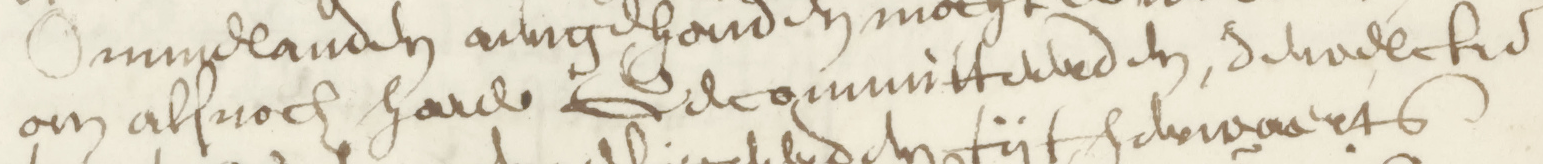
om alsnoch hare Gecommitteerden, dewelcke
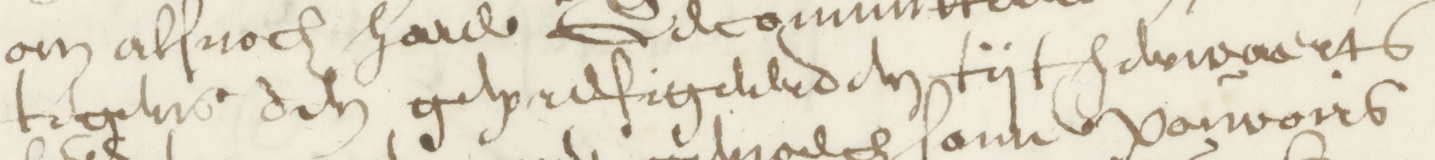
tegen den geprefigeerden tijt herwaerts
